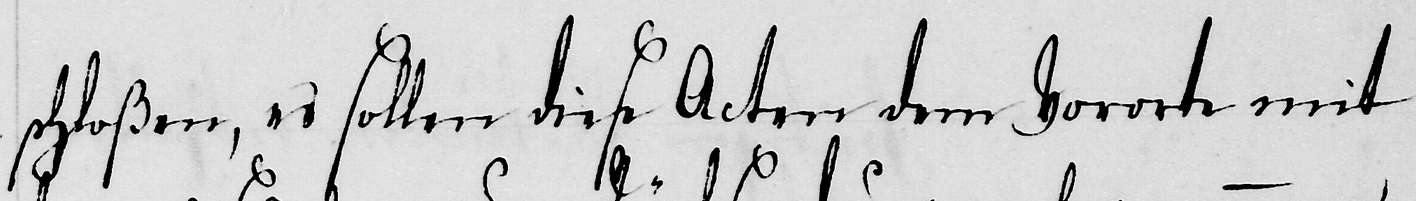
schloßen, es sollen diese Acten dem Vororte mit
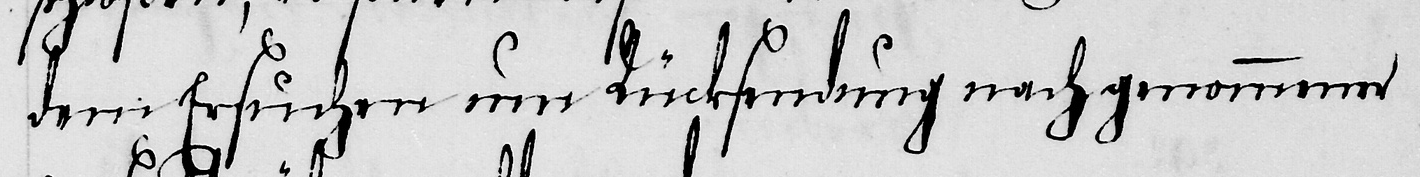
dem Ersuchen um Rücksendung nach genommener
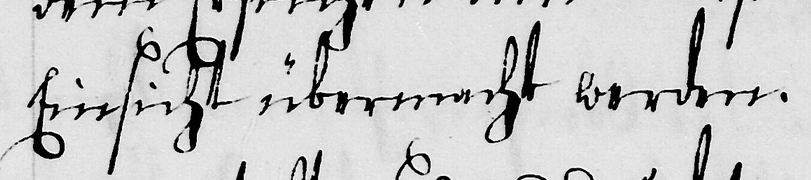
Einsicht übermacht werden.
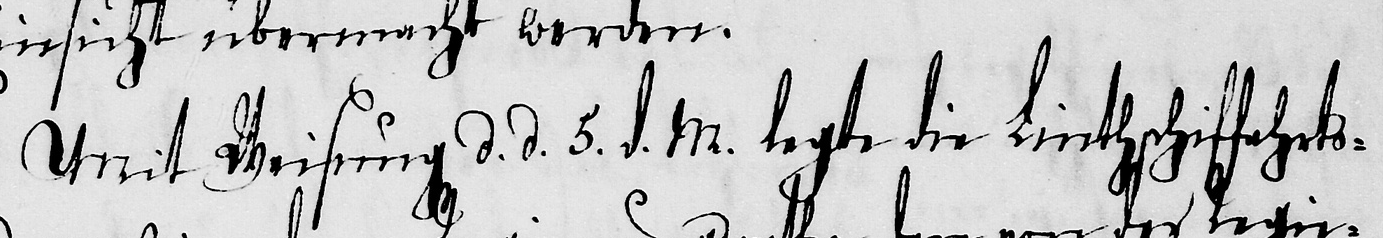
Mit Weisung d. d. 5. d. M. legte die Linthschiffahrt¬
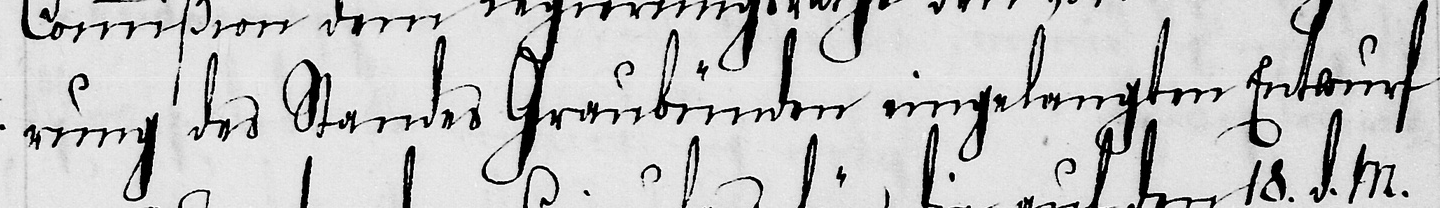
rung des Standes Graubünden eingelegten Entwurf
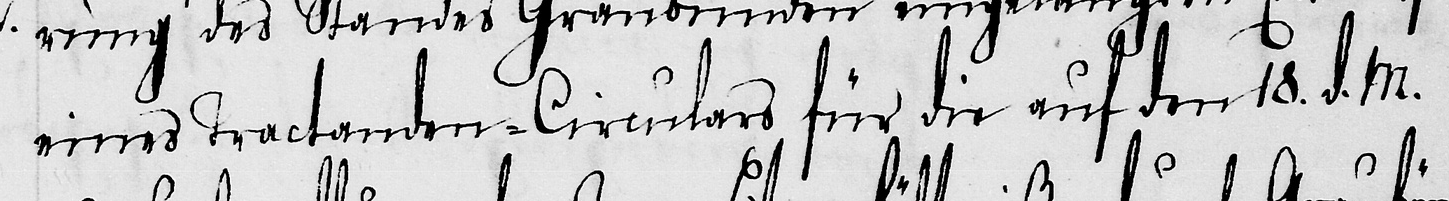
eines Tractanden-Circulars für die auf den 18. d. M.
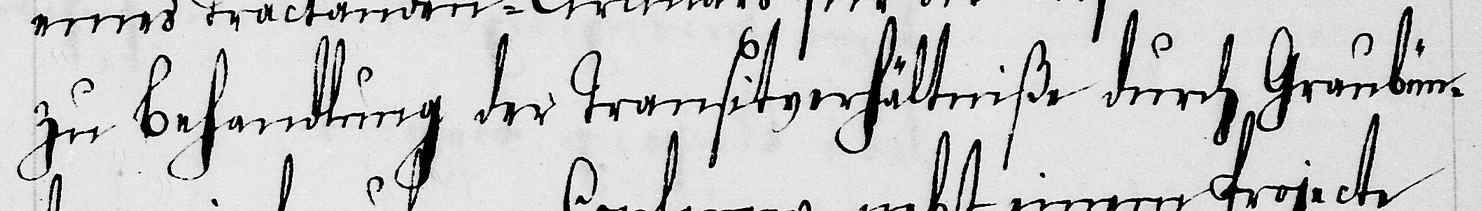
zu Behandlung der Transitverhältniße durch Graubün¬
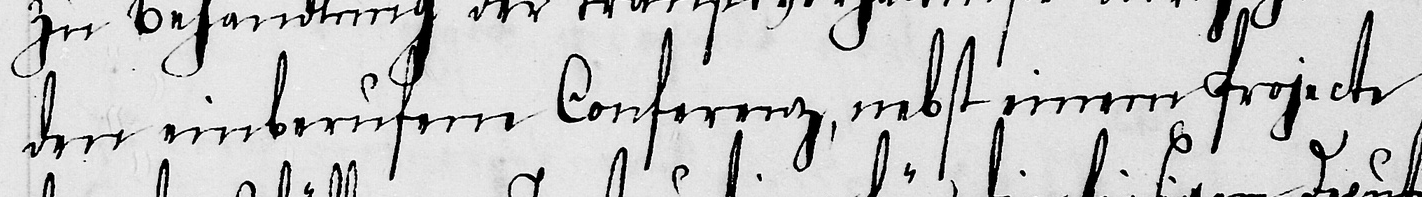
den einberufene Conferenz, nebst einem Projecte
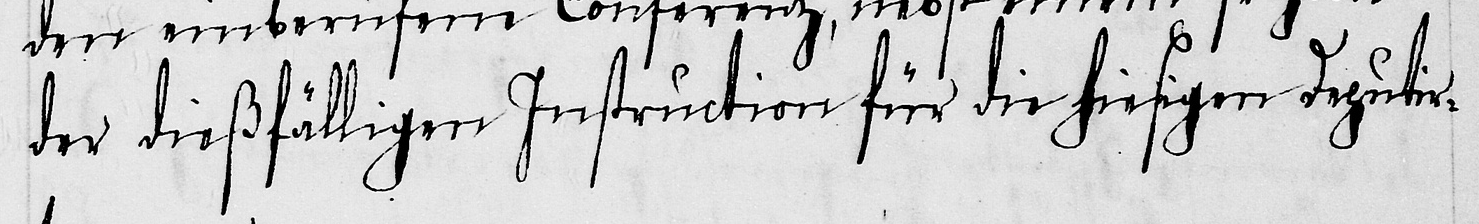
der dießfälligen Instruction für die hiesigen Deputir¬
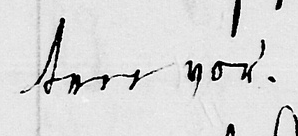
ten vor.
